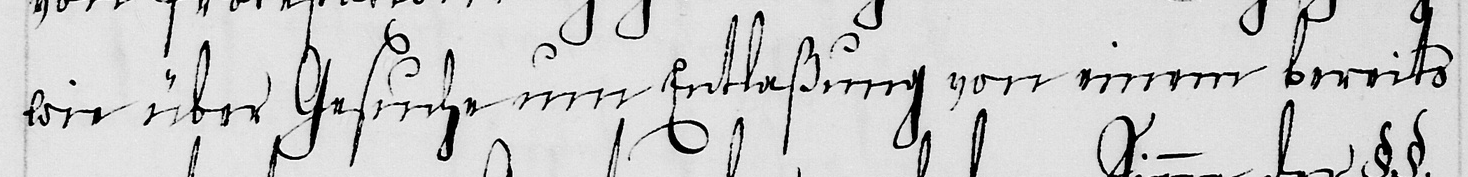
wie über Gesuche um Entlaßung von einem bereits
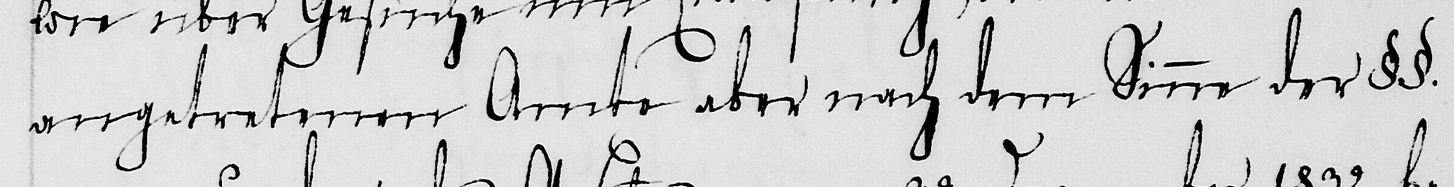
angetretenen Amte aber nach dem Sinne der §§.
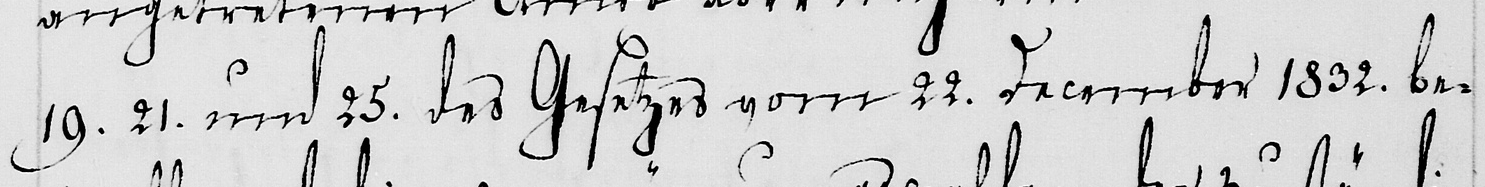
19. 21. und 25. des Gesetzes vom 22. December 1832. be¬
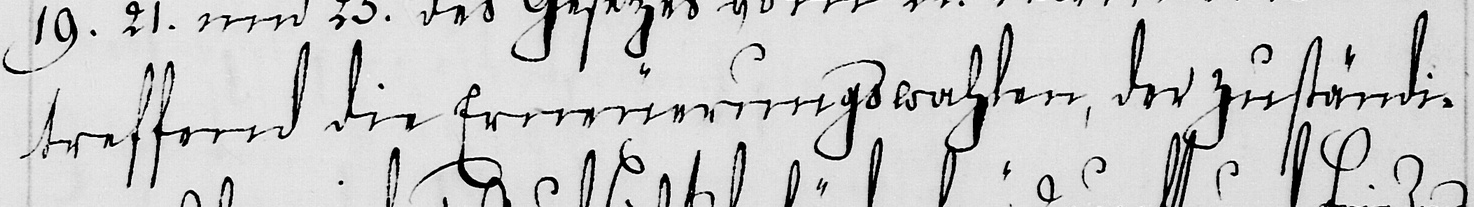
treffend die Erneuerungswahlen, der zuständi¬
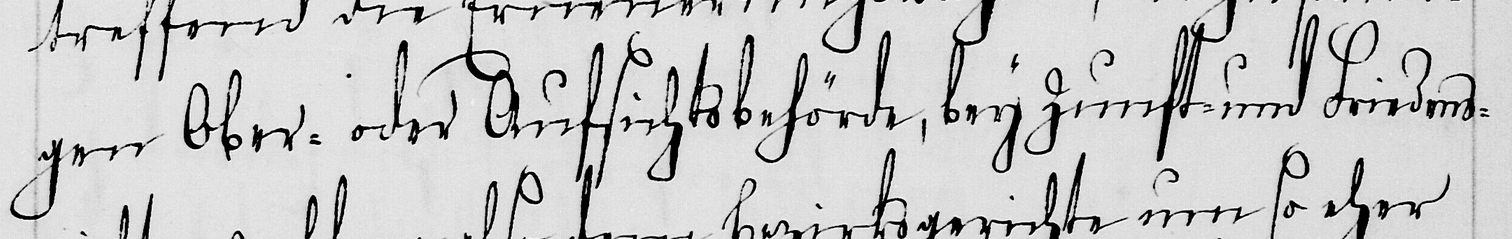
gen Ober- oder Aufsichtsbehörde, bey Zunft- und Fr¬
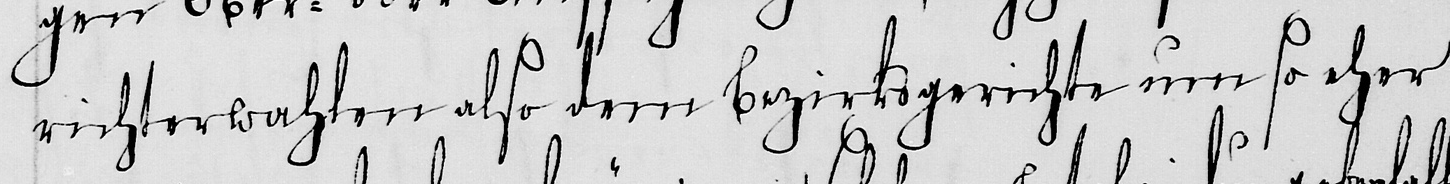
richterwahlen also dem Bezirksgerichte um so eher
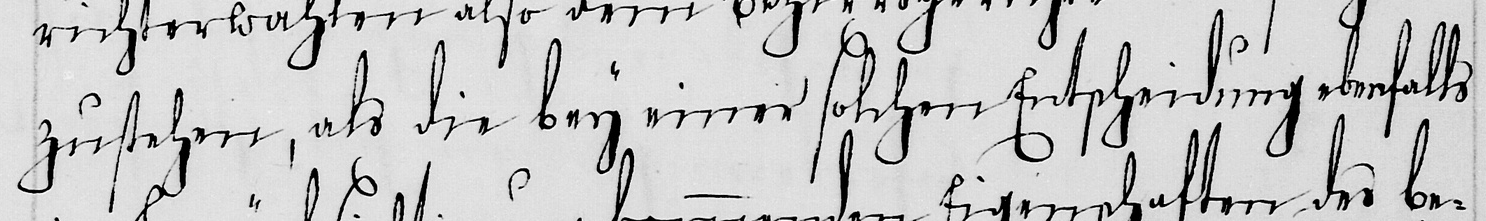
zustehen, als die bey einer solchen Entscheidung ebenfal¬
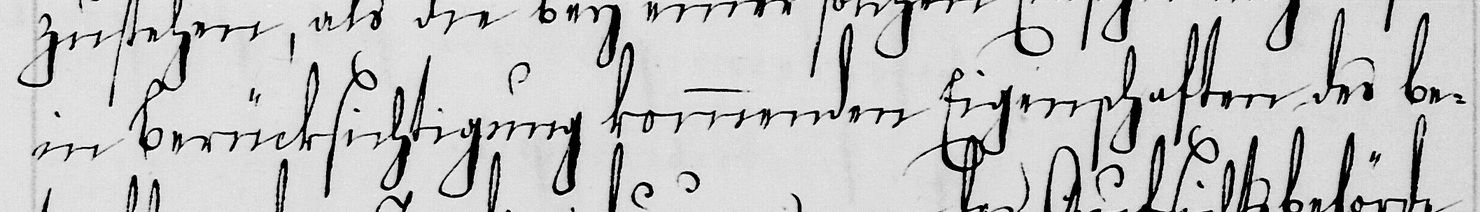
in Berücksichtigung kommenden Eigenschaften des be¬
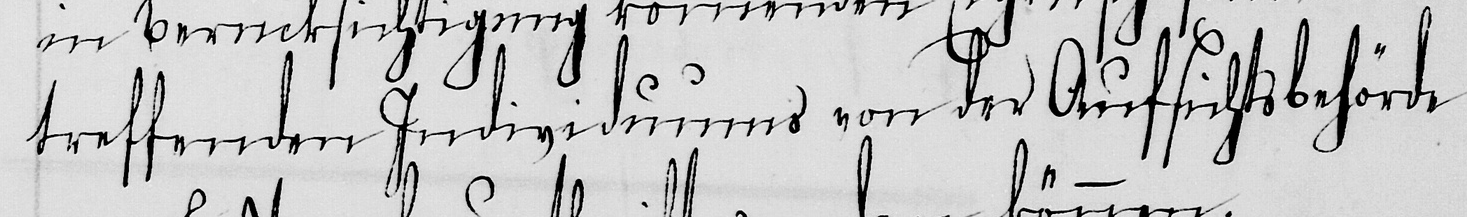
treffenden Individuums von der Aufsichtsbehörde
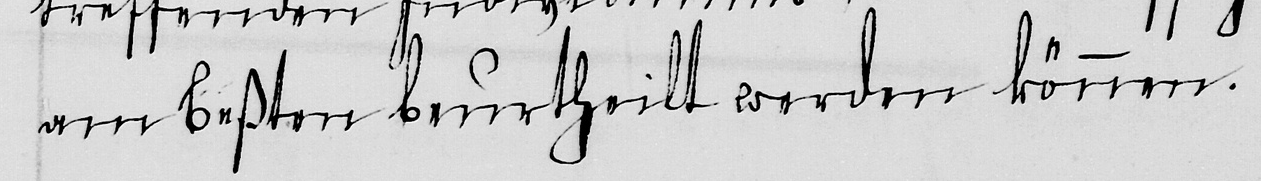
am beßten beurtheilt werden können.
